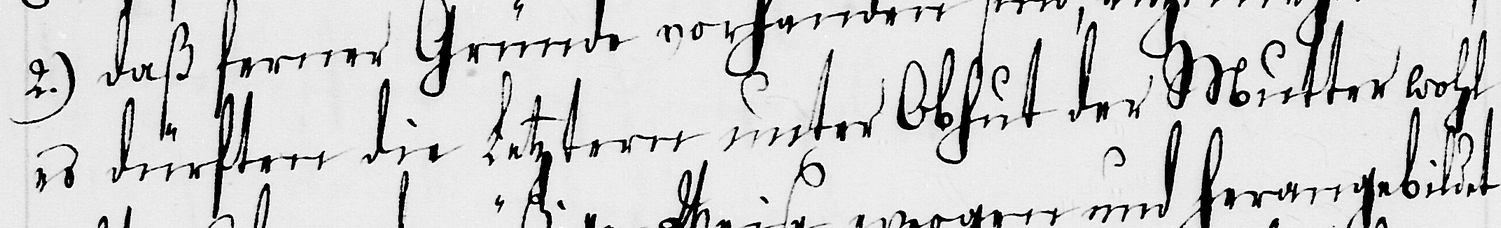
es dürften die Letztern unter Obhut der Mutter wohl
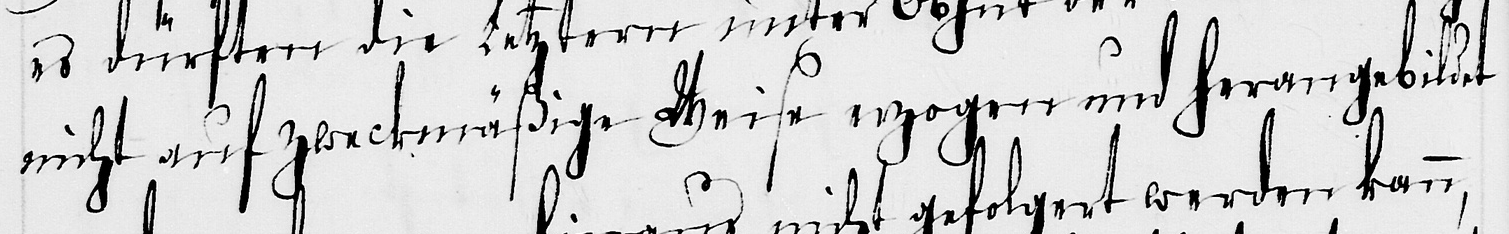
nicht auf zweckmäßige Weise erzogen und herangebildet
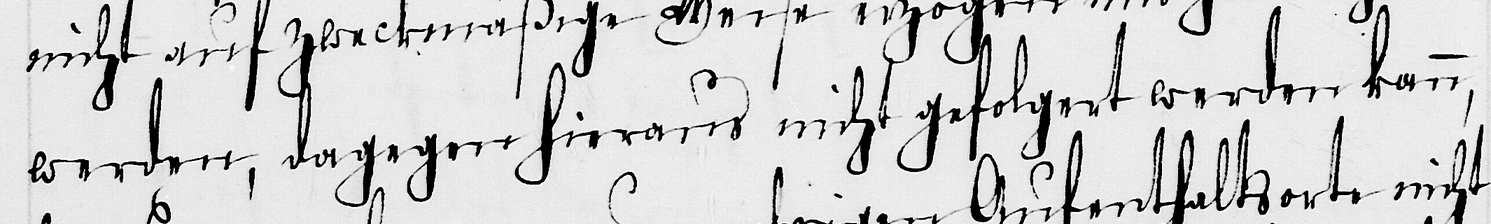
werden, dagegen hieraus nicht gefolgert werden kann,
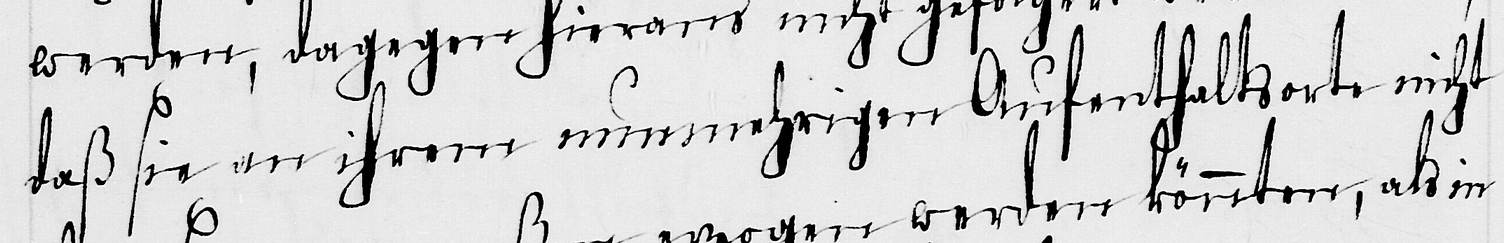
daß sie an ihrem nunmehrigen Aufenthaltsorte nicht
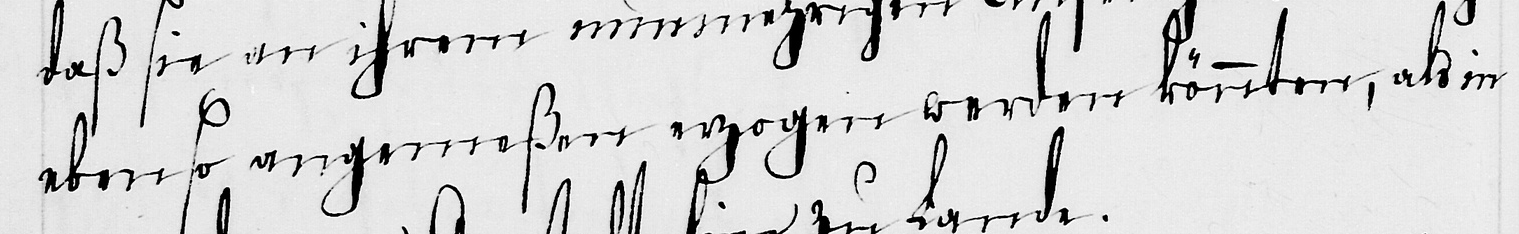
ebenso angemeßen erzogen werden könnten, als in
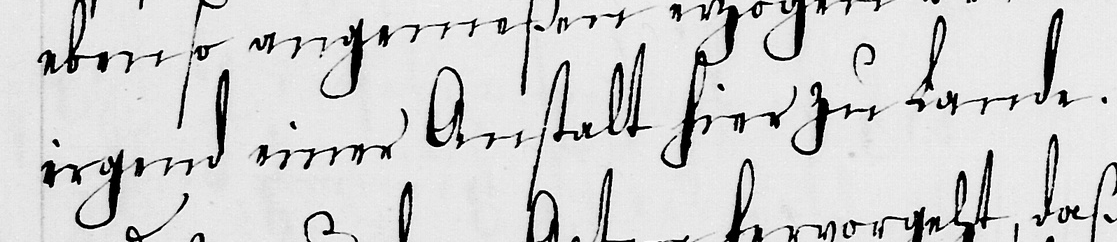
irgend einer Anstalt hier zu Lande.
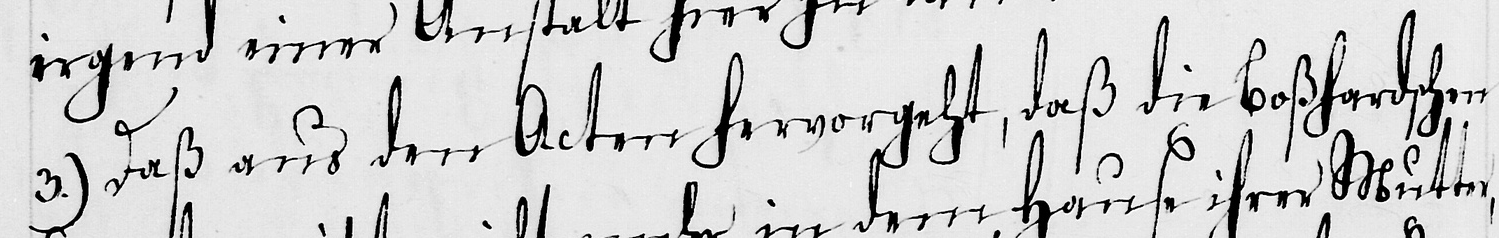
3.) Daß aus den Acten hervorgeht, daß die Boßhardschen
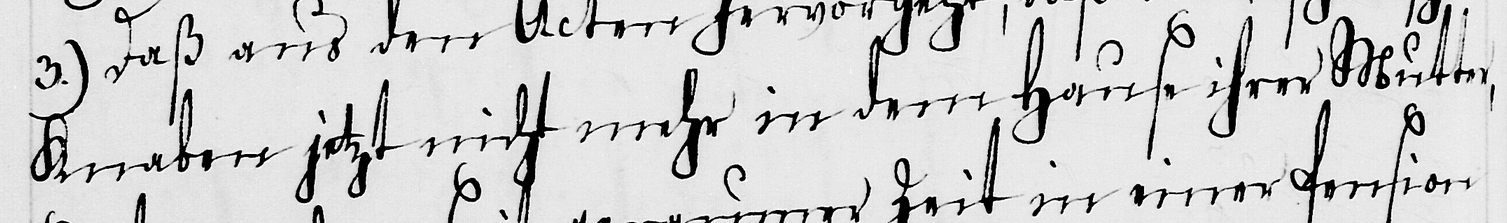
Knaben jetzt nicht mehr in dem Hause ihrer Mutter,
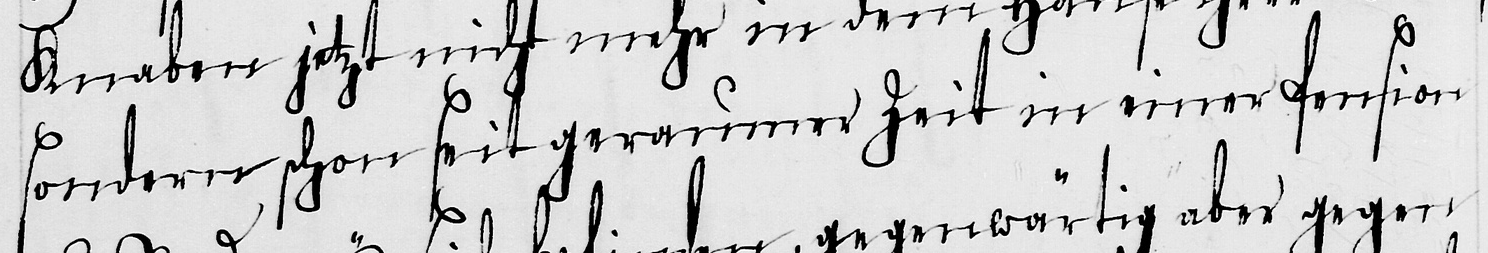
sondern schon seit geraumer Zeit in einer Pension
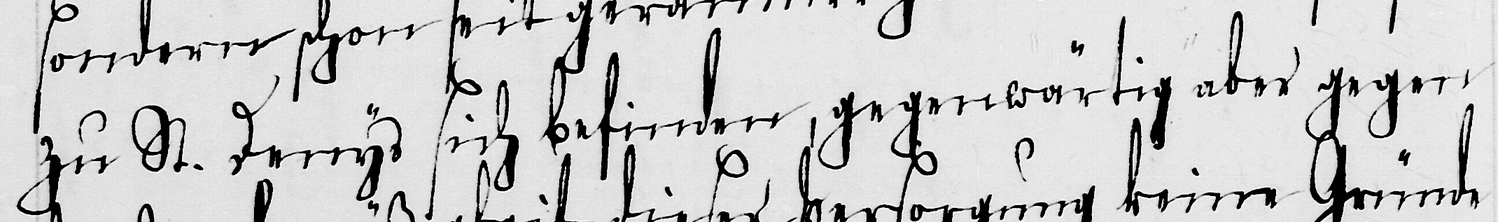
zu St. Denys sich befinden, gegenwärtig aber gegen
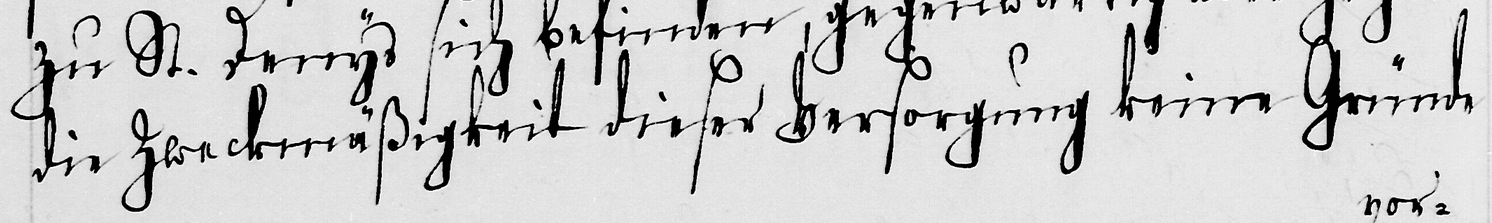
die Zweckmäßigkeit dieser Versorgung keine Gründe
